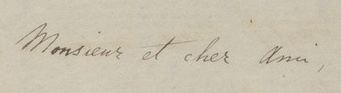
Monsieur et cher ami,
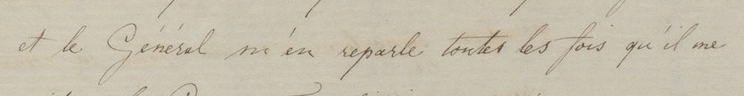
et le Général m'en reparle toutes les fois qu'il me
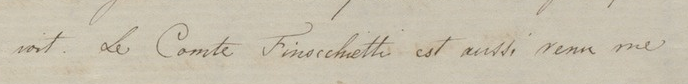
voit. Le Comte Finscchietti est aussi venu me
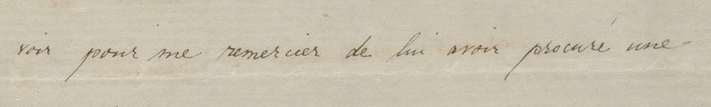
voir pour me remercier de lui avoir procuré une
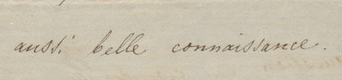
aussi belle connaissance.
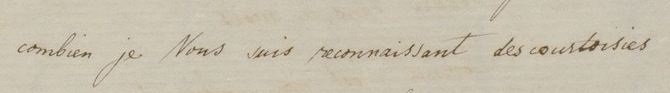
combien je Vous suis reconnaissant de courtoisies
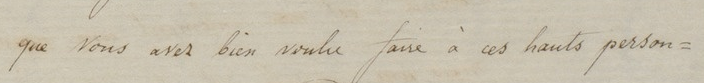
que Vous avez bien voulu faire à ces hauts person-
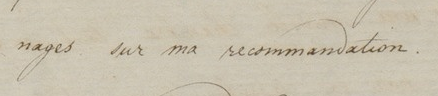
nages sur ma recommandation.
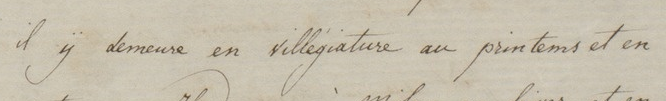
il y demeure en villégiature au printems et en
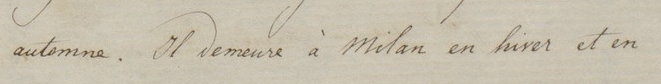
automne. Il demeure à Milan en hiver et en
